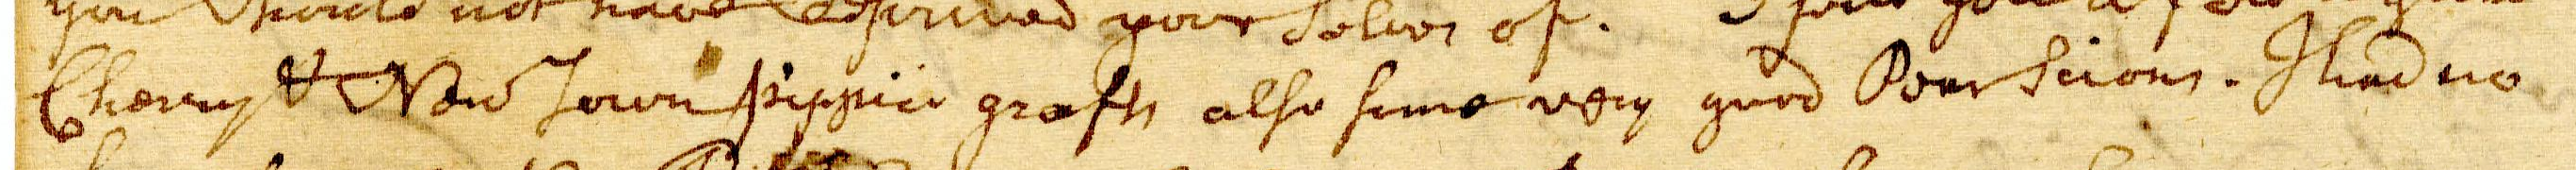Cherry & New Town pippie grafts also some very good Pear scions. I had no
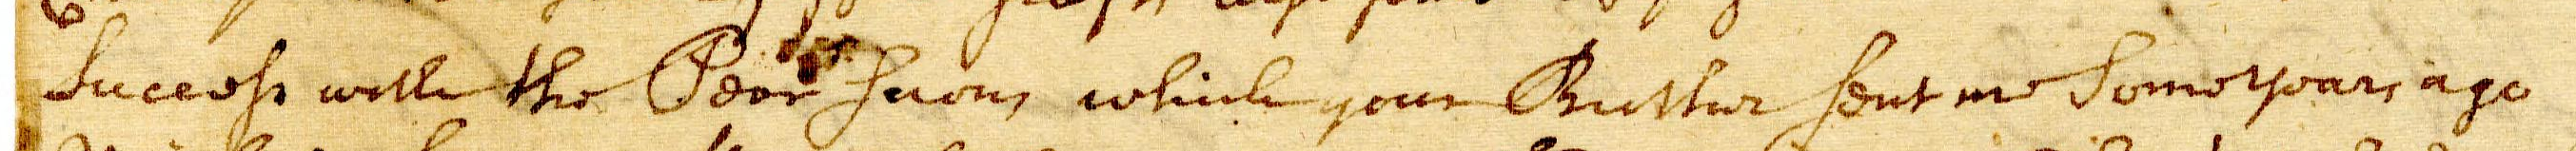success with the Pear scions which your Brother sent me some years ago
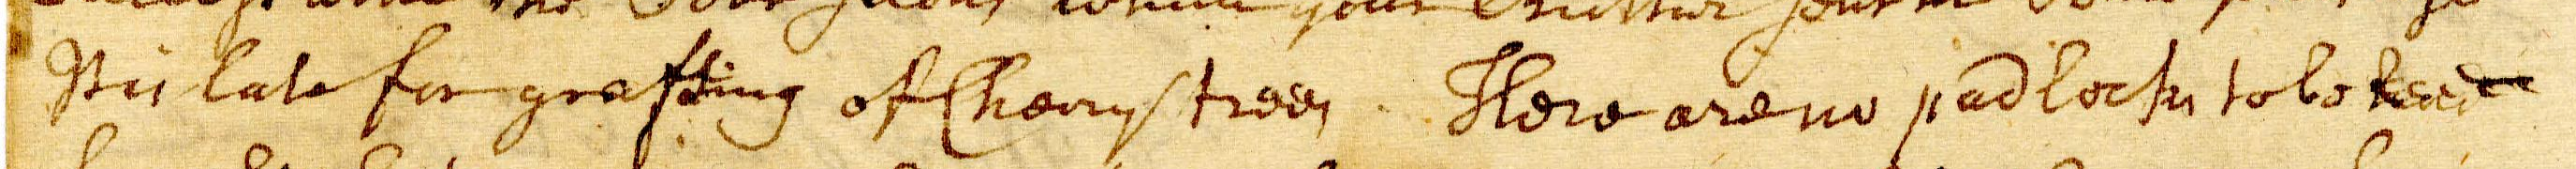It is late for grafting of Cherry trees. Here are no padlocks to be [had]
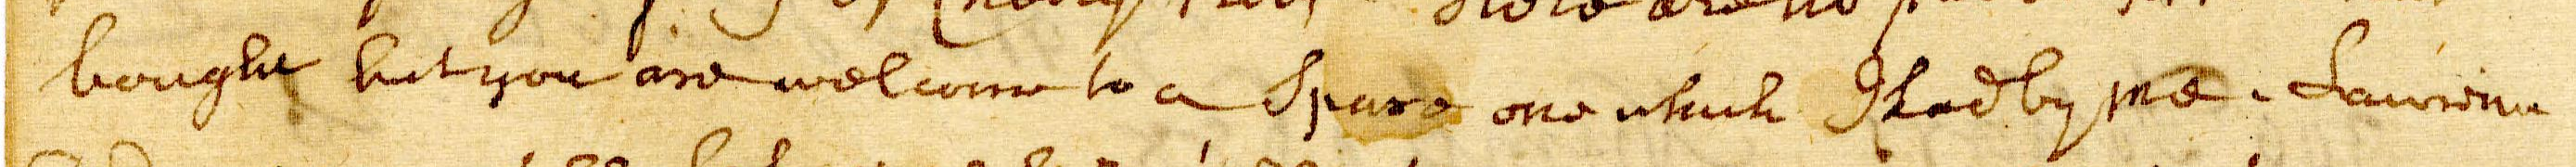bought but you are welcome to a Spare one which I had by me. Lawrence
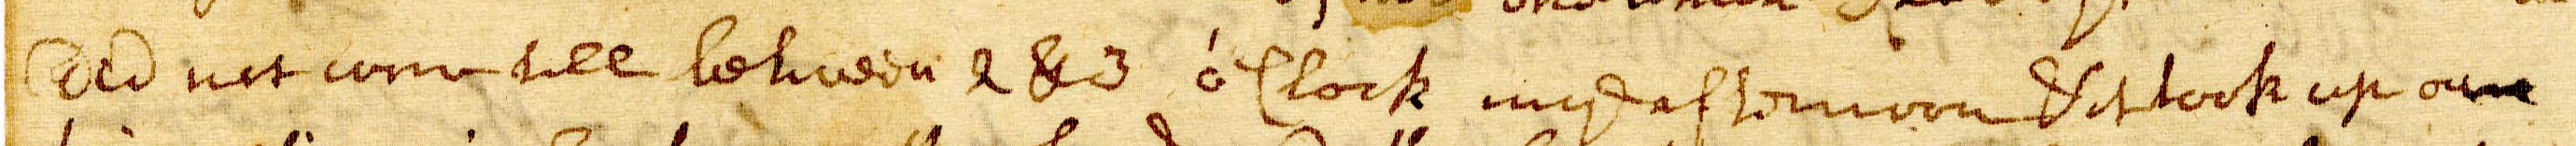did not come till between 2 & 3 'o Clock in y^e afternoon & is took up one
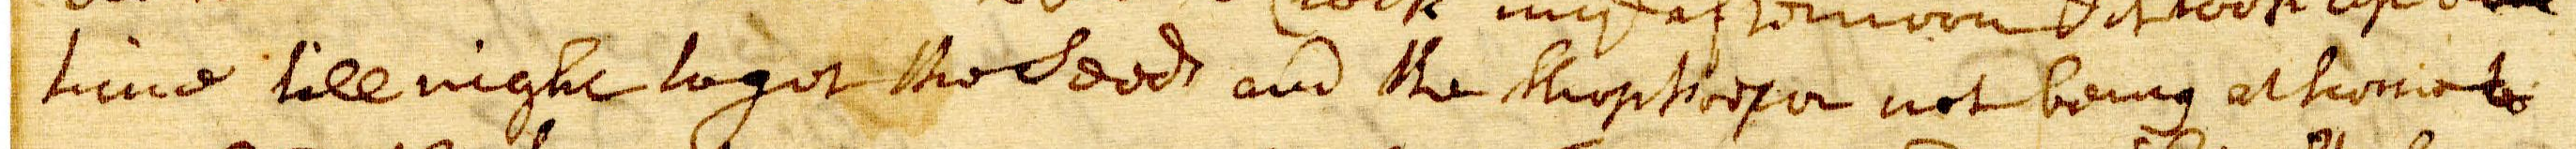twice till night to get the seeds and the shopkeeper not being at home
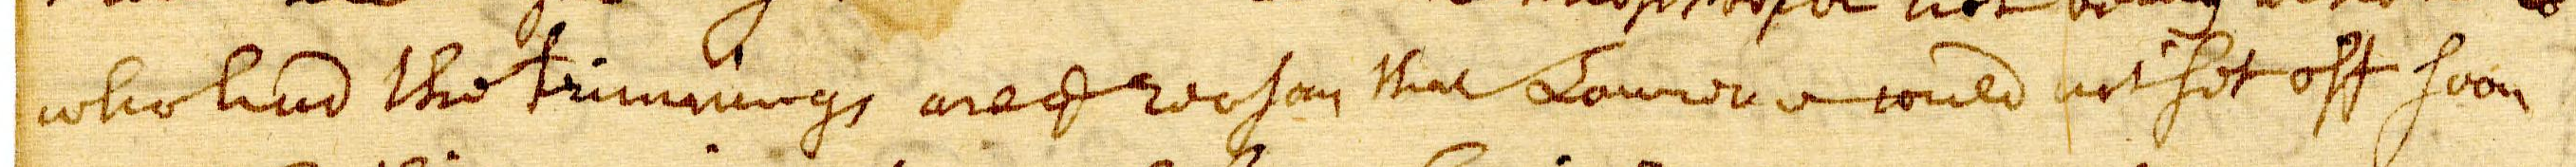who had the trimmings are y^e reasons that Lawrence could not set off soon
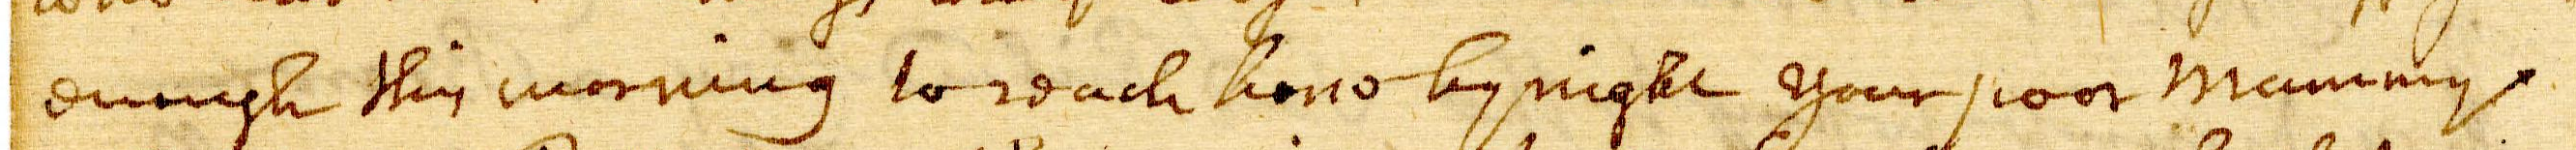enough this morning to reach here by night your poor Mammy
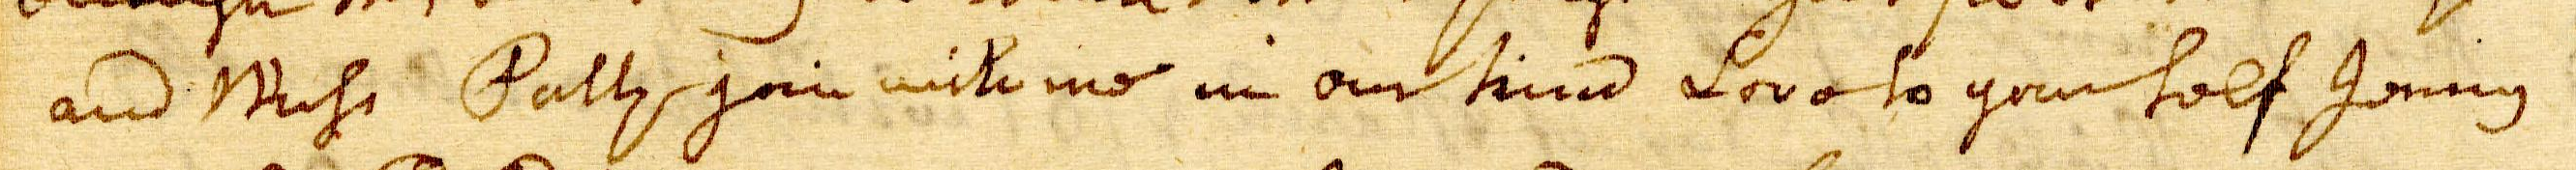and Miss Patty join with me in our kind Love to your self Jenny
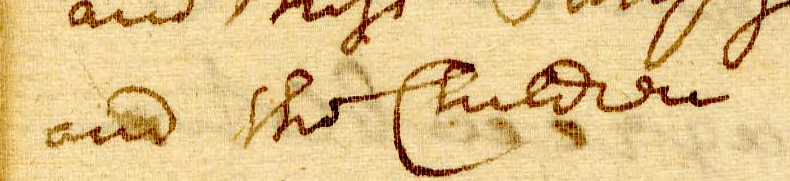and the Children
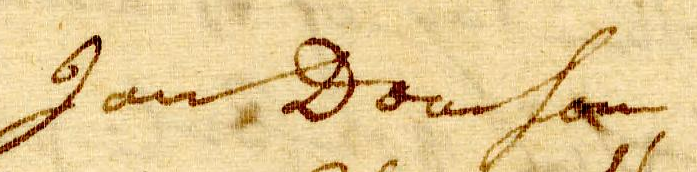I am Dear Son
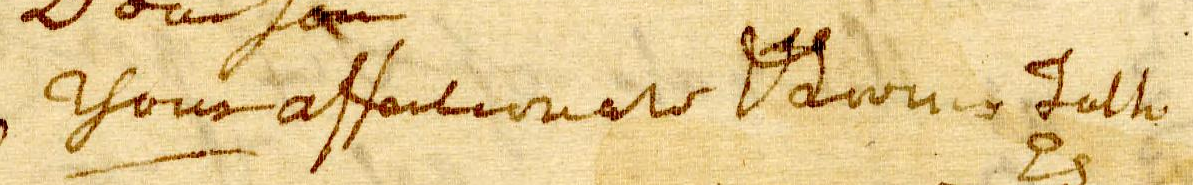Your affectionate & Loving Fath
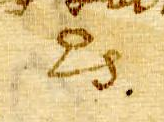ES.
